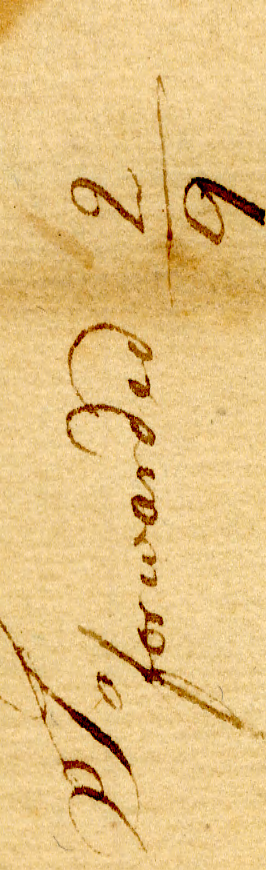To Forwarded 2/9
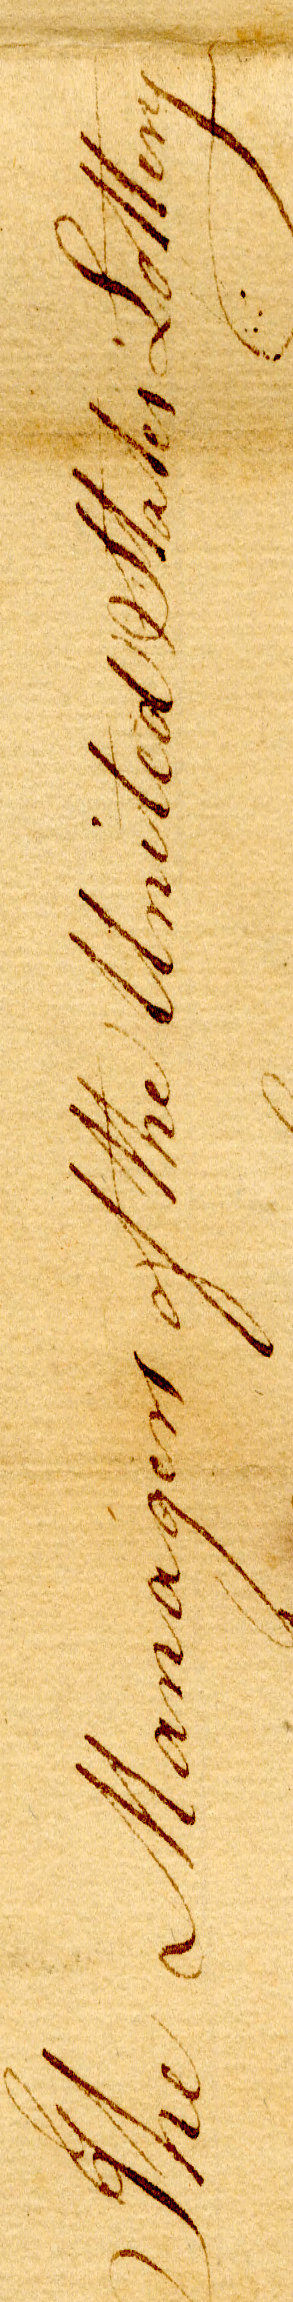The Managers of the United States Lottery
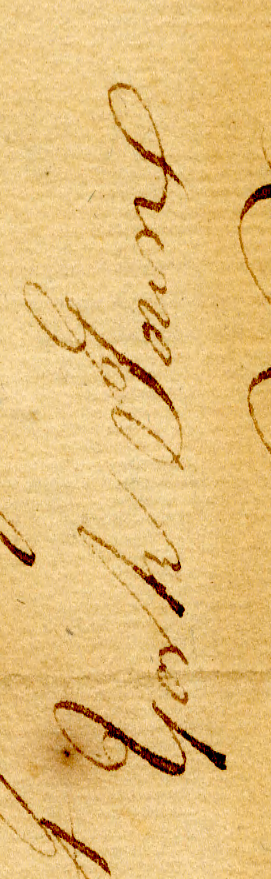York Town
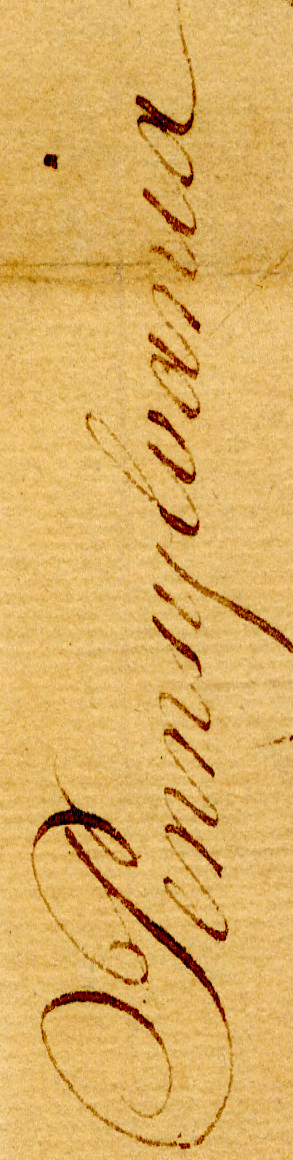Pennsylvania
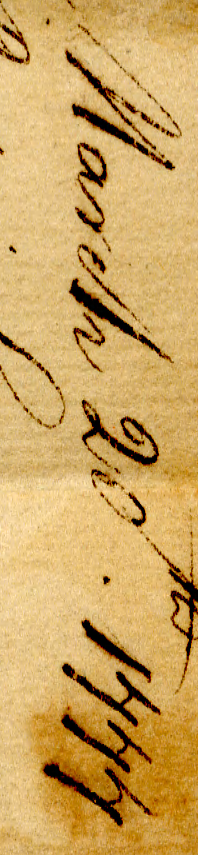March 20^th. 1777
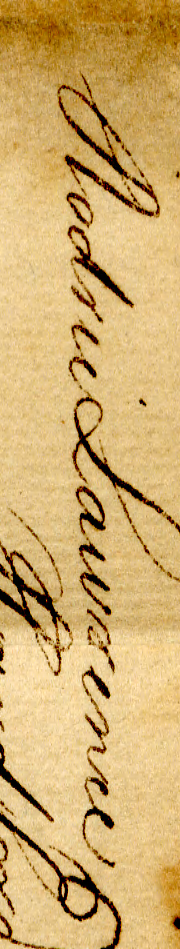Rodric Lawrence
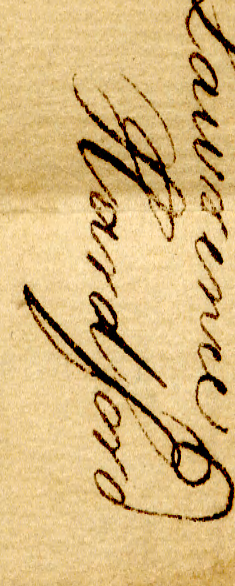Hardford
